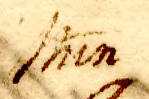then
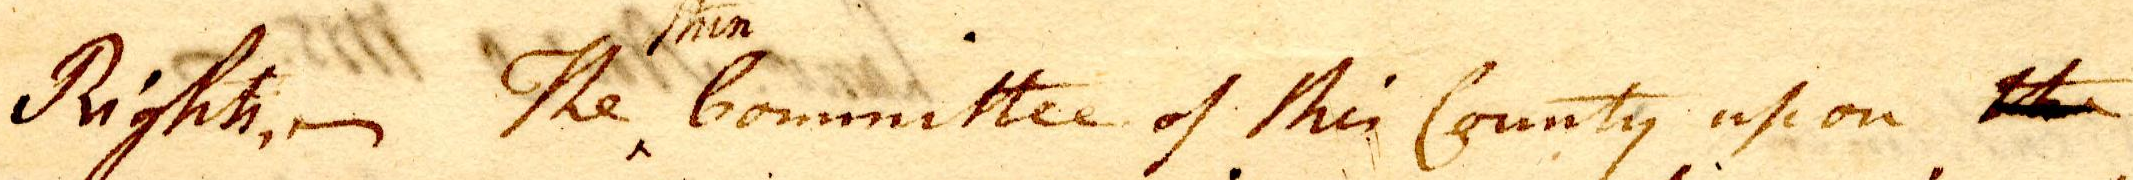Rights. The ^ Committee of this County upon [the]
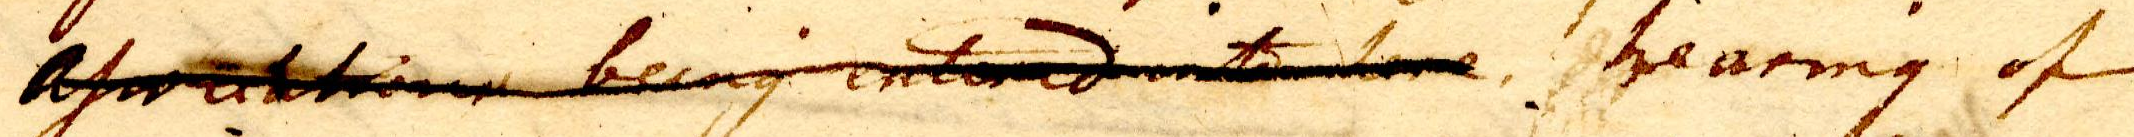[Associations being entered into here] hearing of
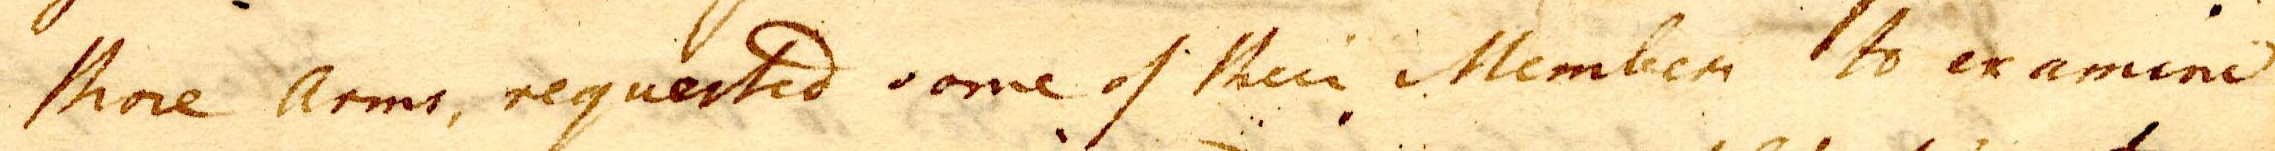those Arms, requested some of their Member to examine
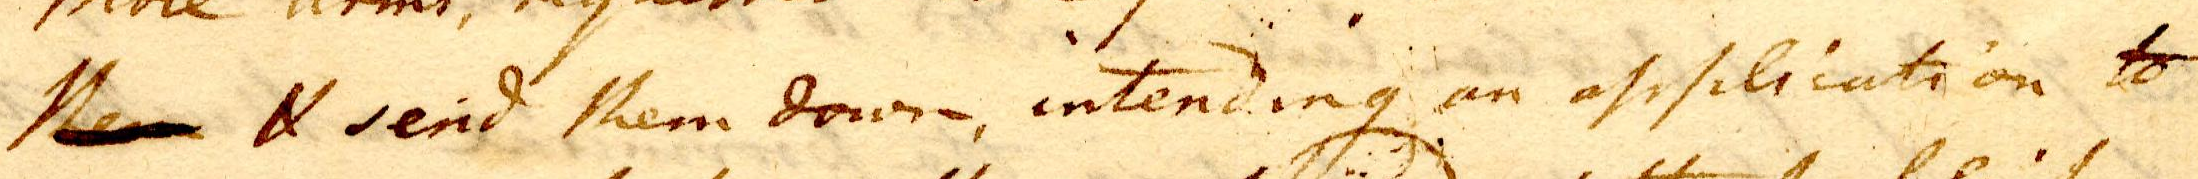[them] & send them down, intending an application to
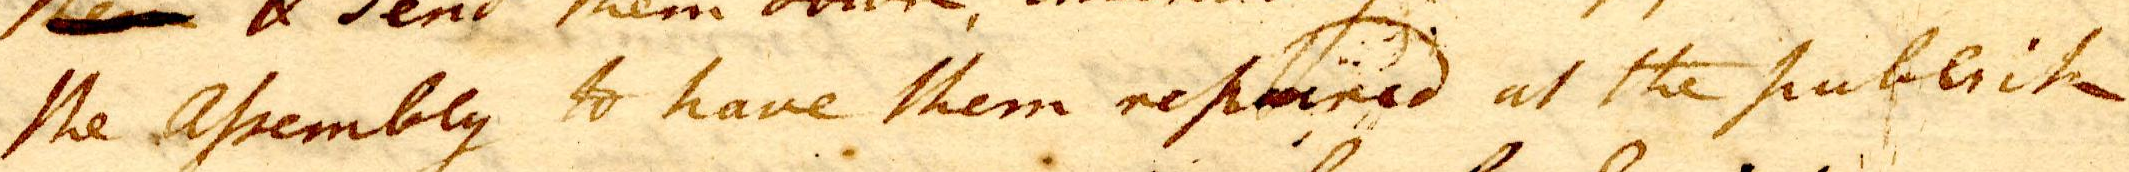the assembly to have them repaired at the publick
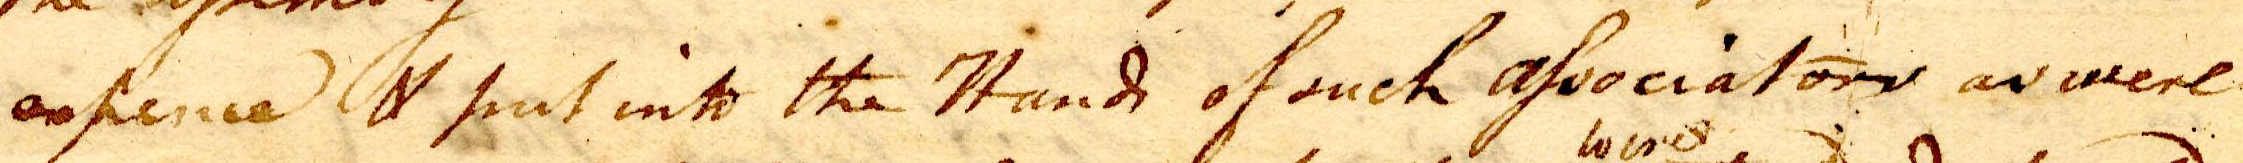essence & put into the Hands of such associators as were
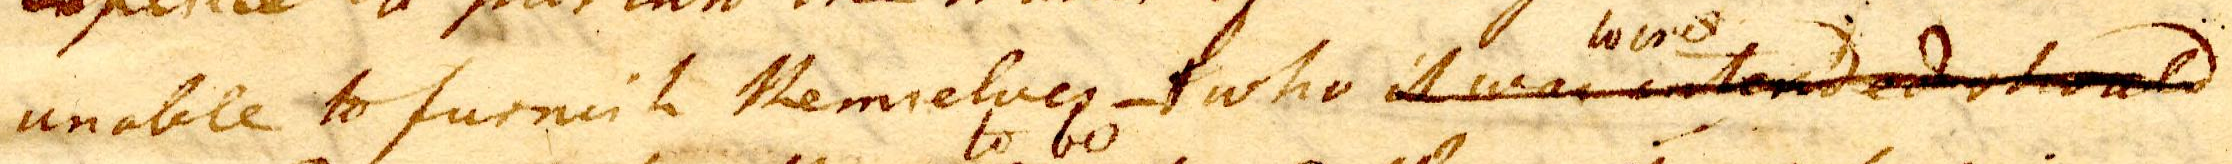unable to furnish themselves, & who [it was intended should]
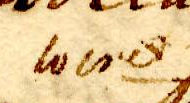were
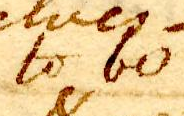to be
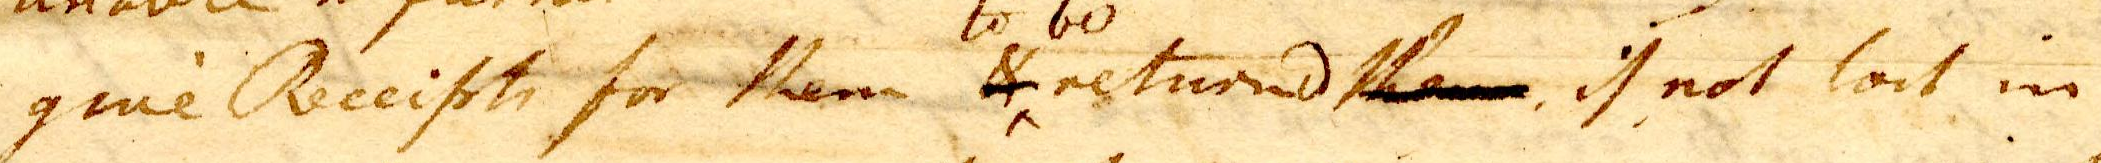give Receipts for them [&[ ^ returned [them] if not lost in
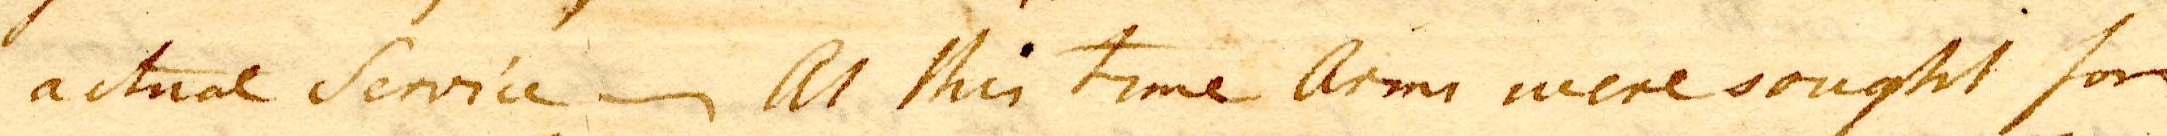actual Service. At this time Arms were sought for
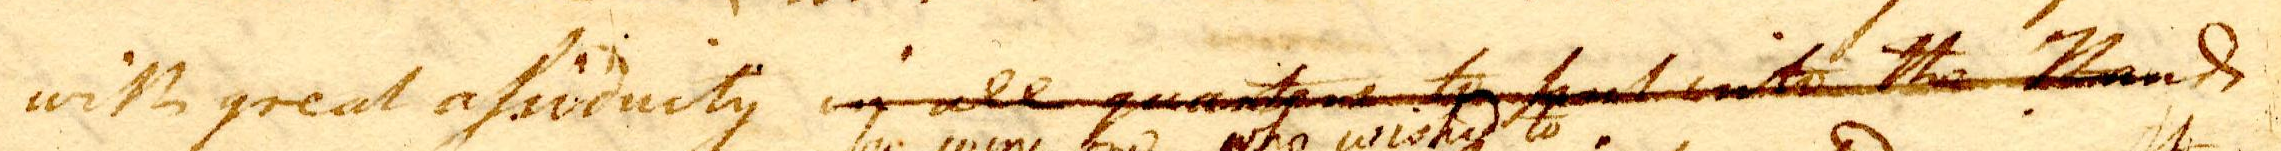with great assiduity [in all quarters to put into the Hands]
